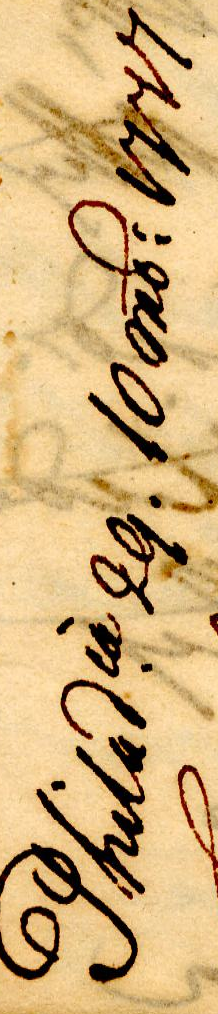Philad^ia. 29 10 mo: 1777
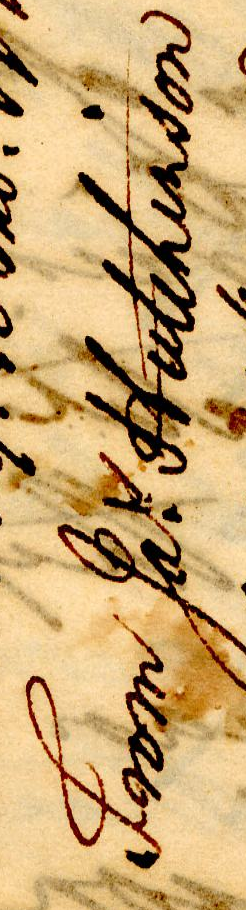From Ja^s. Hutchinson
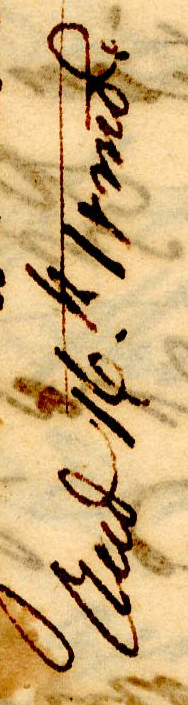recd 16^th 11 mo.
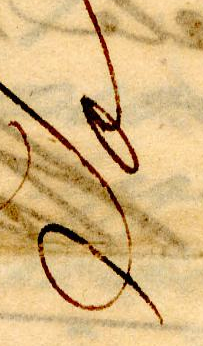To
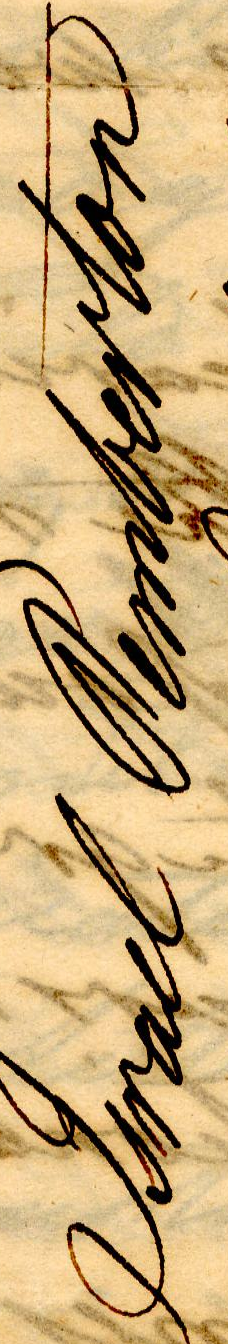Israel Pemberton
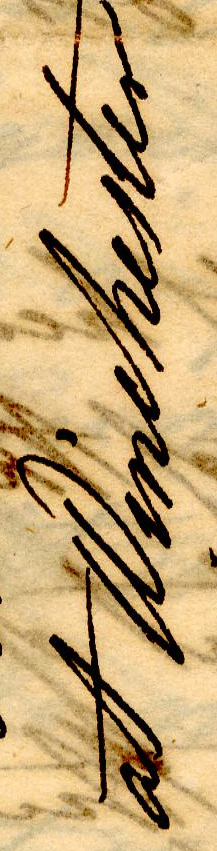at Winchester
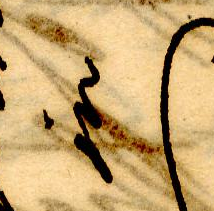in
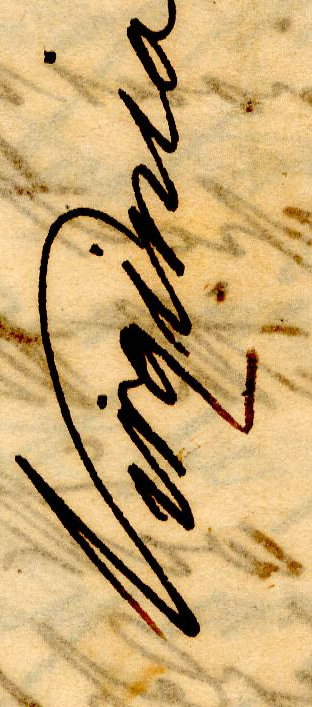Virginia
